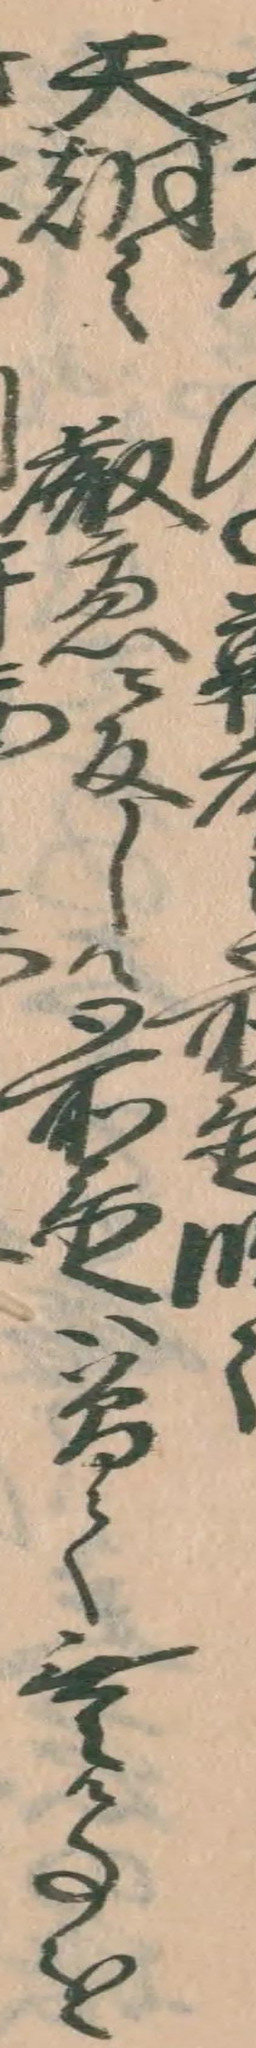天朝之叡慮ニ反し候御所置ハ曽て無之候事を
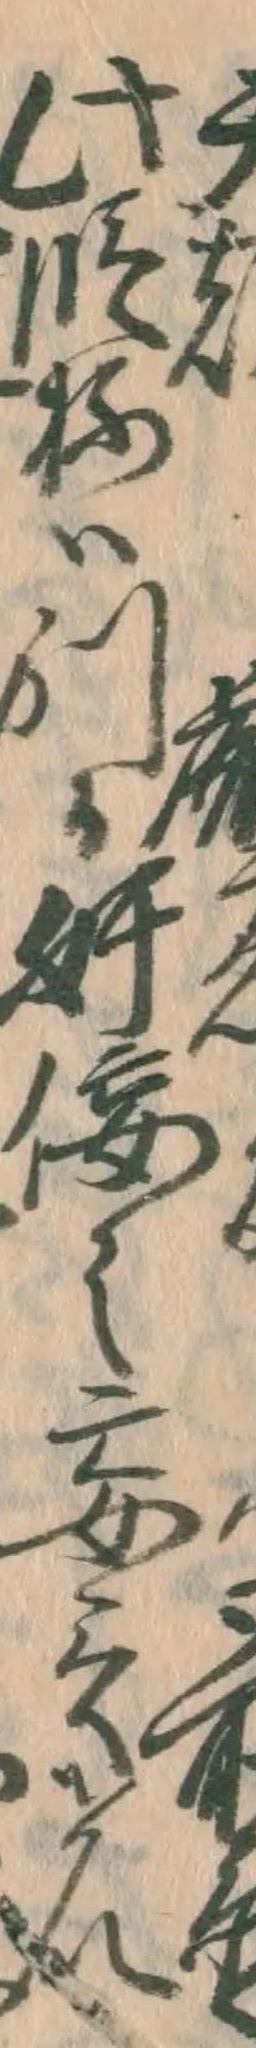此段抔ハ別而奸侫之妄言を以
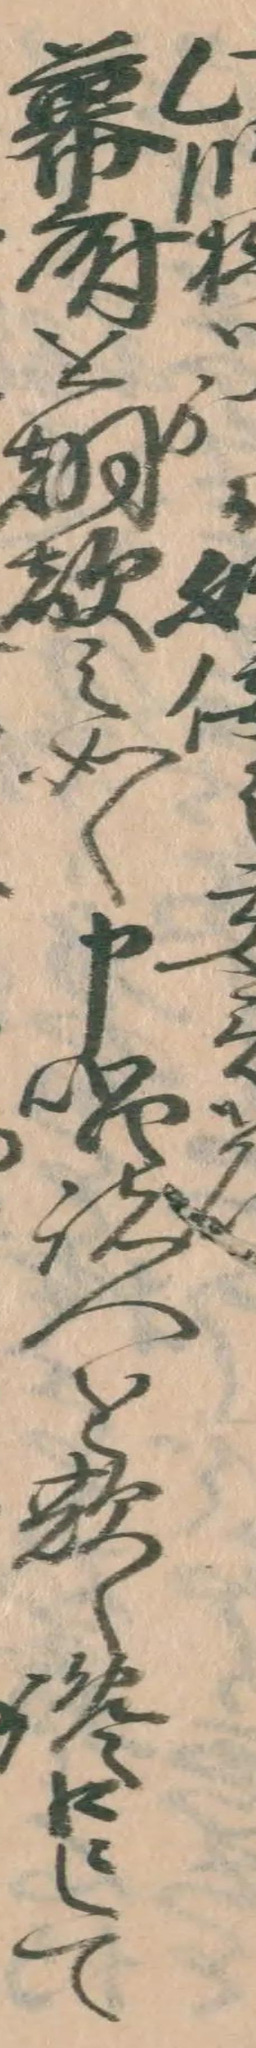幕府を朝敵之如く申唱諸人を欺く讒口ニして
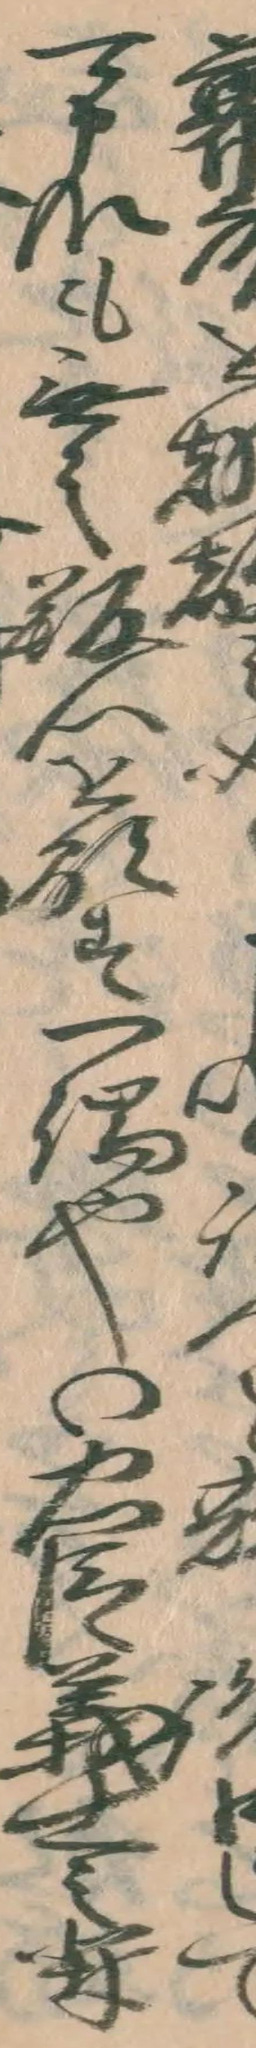可申様も無之叛心を顕す一端や○忠臣義士之輩
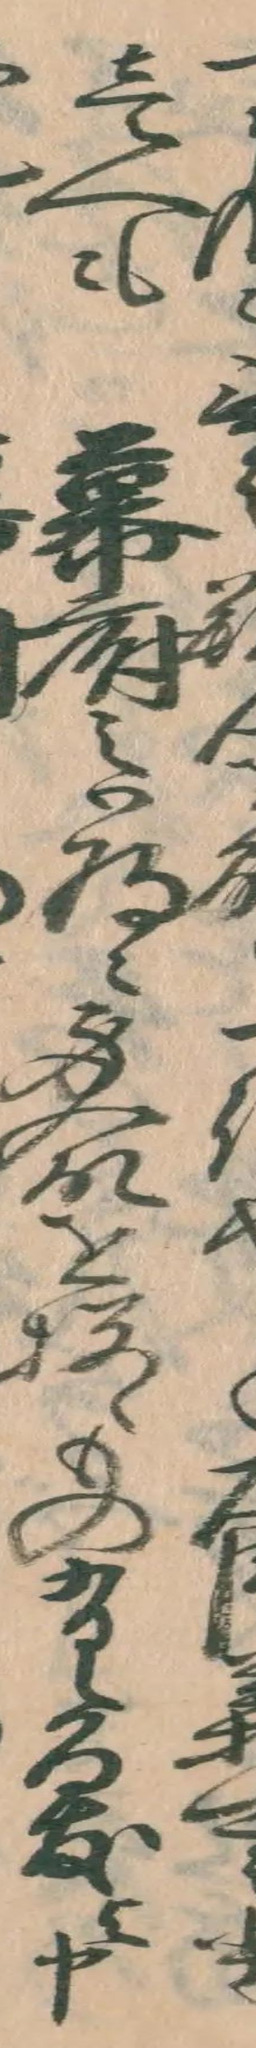壱人も幕府之御為ニ身命を投候もの有之間敷と申
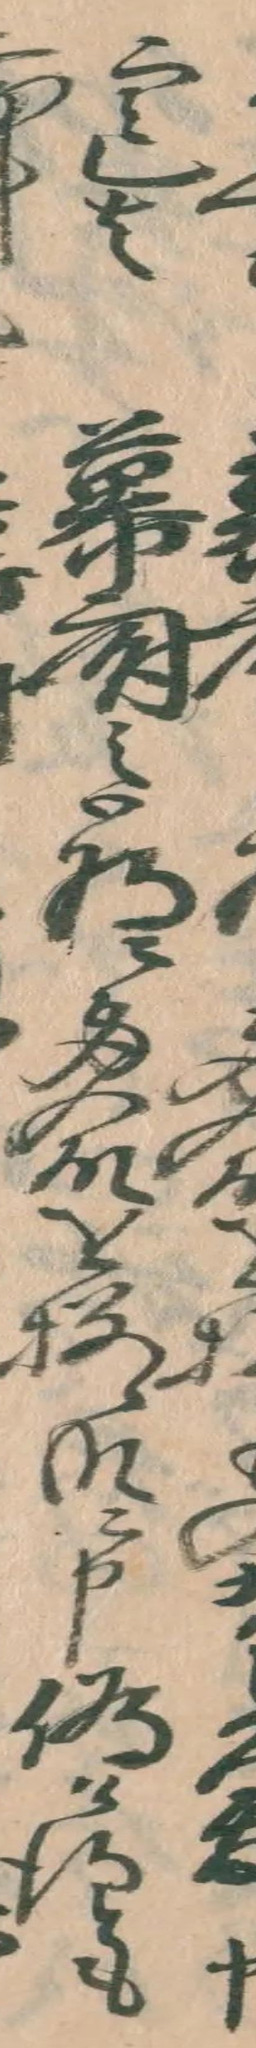而已者幕府之御為ニ身命を投候様ニ申偽候得とも
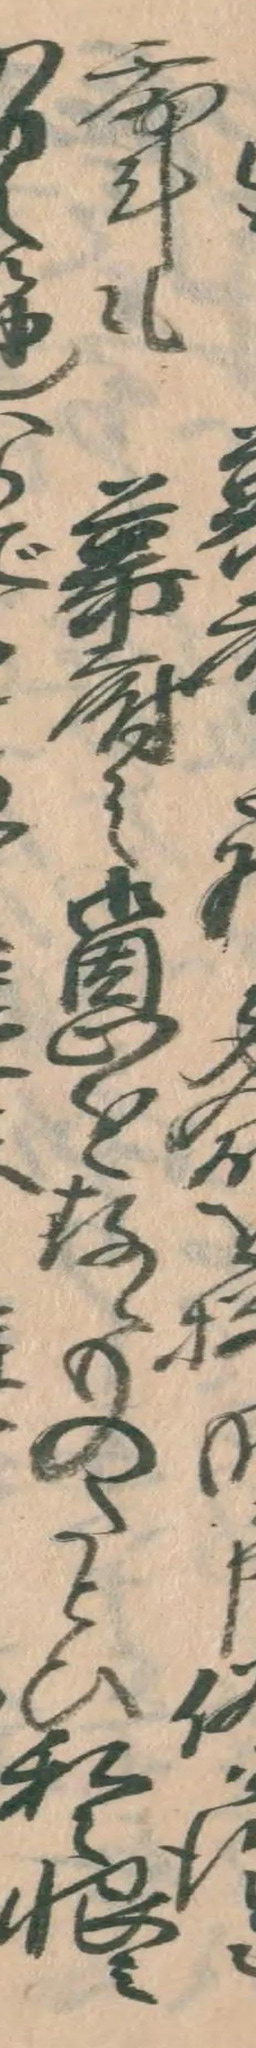露斗も幕府之御恩を存候ものたとひ私之恨ミ
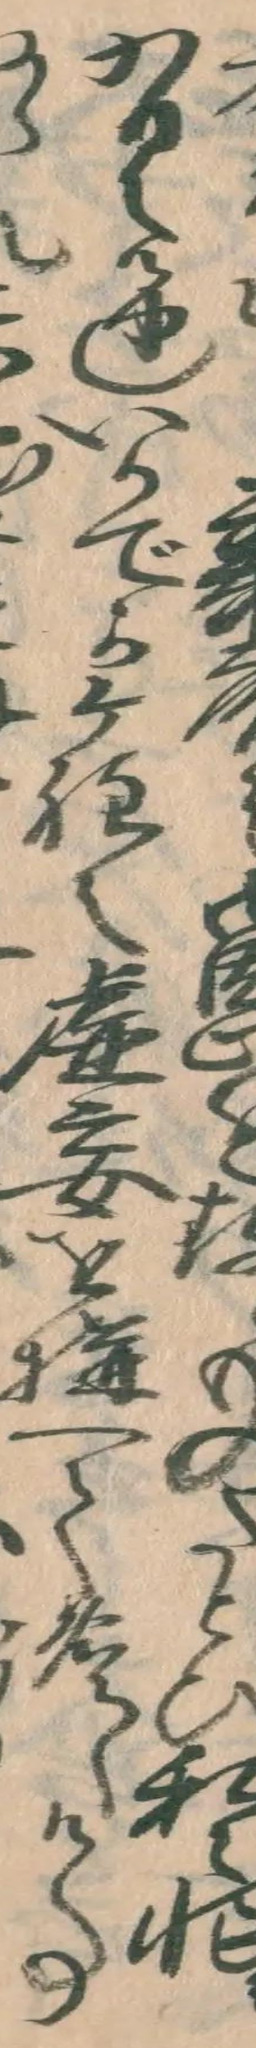有之候迚いかでかケ程之虚妄を構へて讒し候事
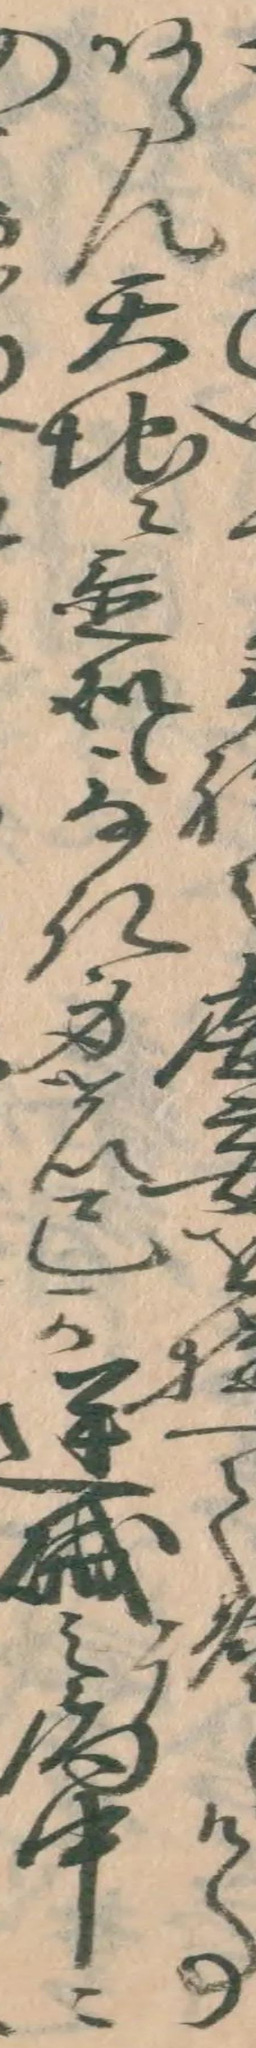あらん天地ニ置処もなき身を以己か逆賊之偽中ニ
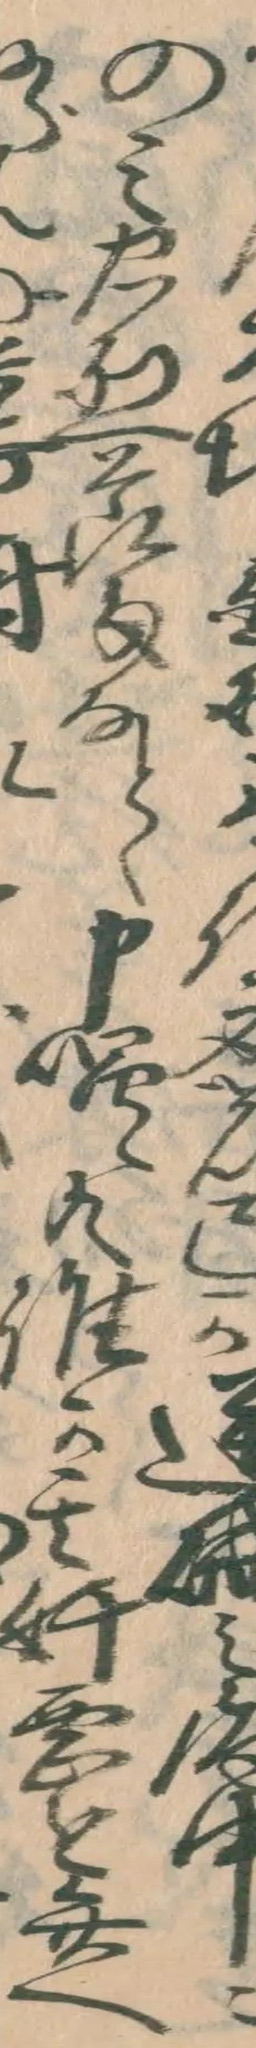のミ忠烈節義なとヽ申唱候共誰か其奸悪を弁へ
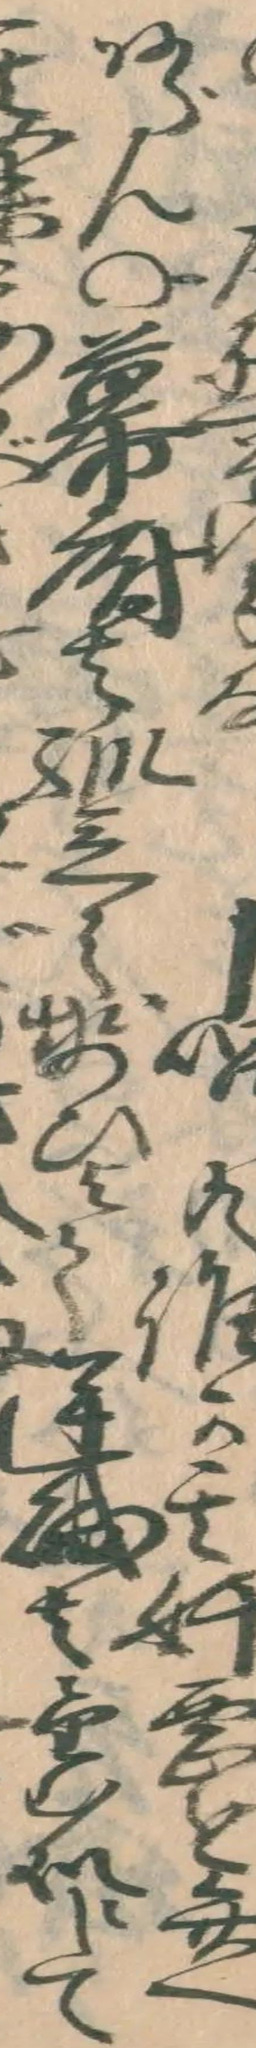あらん○幕府者孤立之勢ひとて逆賊者望む処ニして
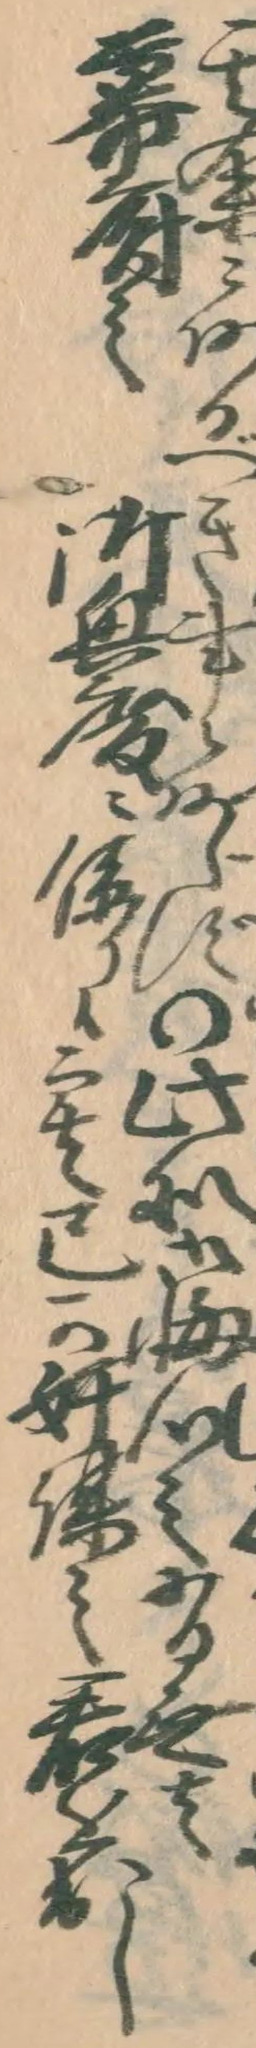幕府之御興廃ニ係り候而者己か奸謀之君を出し

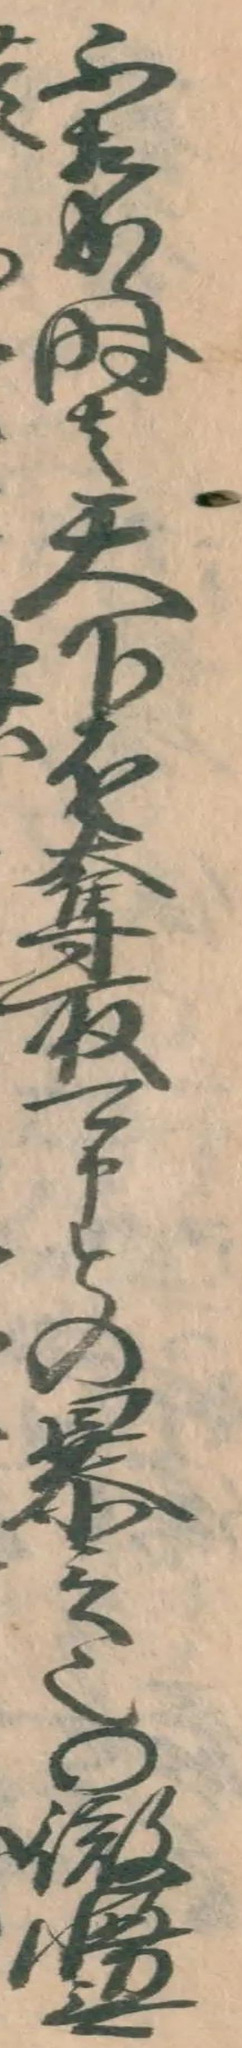不相成候時者天下を奪取可申との暴言也○傲慢無
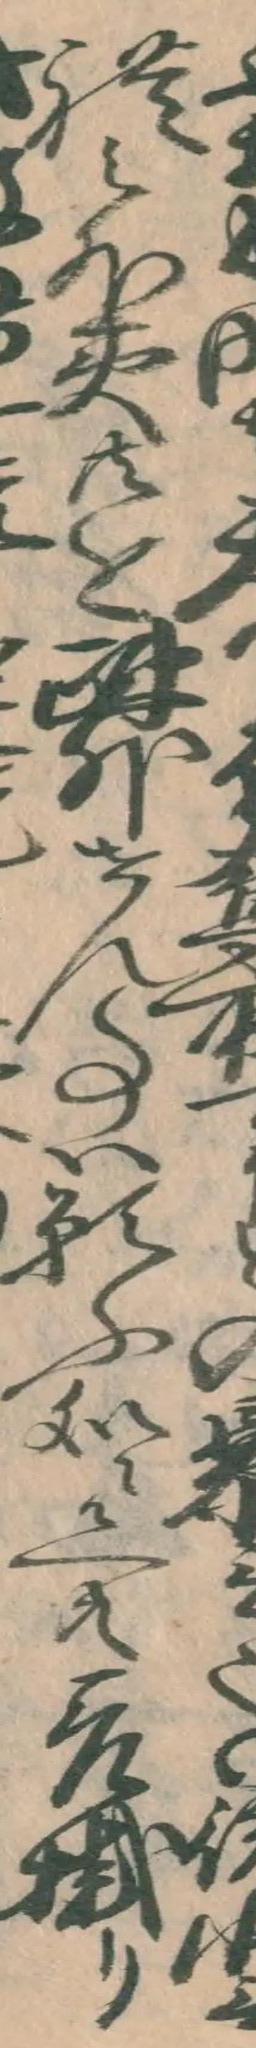禮之外夷共を疎外せん事ハ願ふ処ニ候へ共差掛り
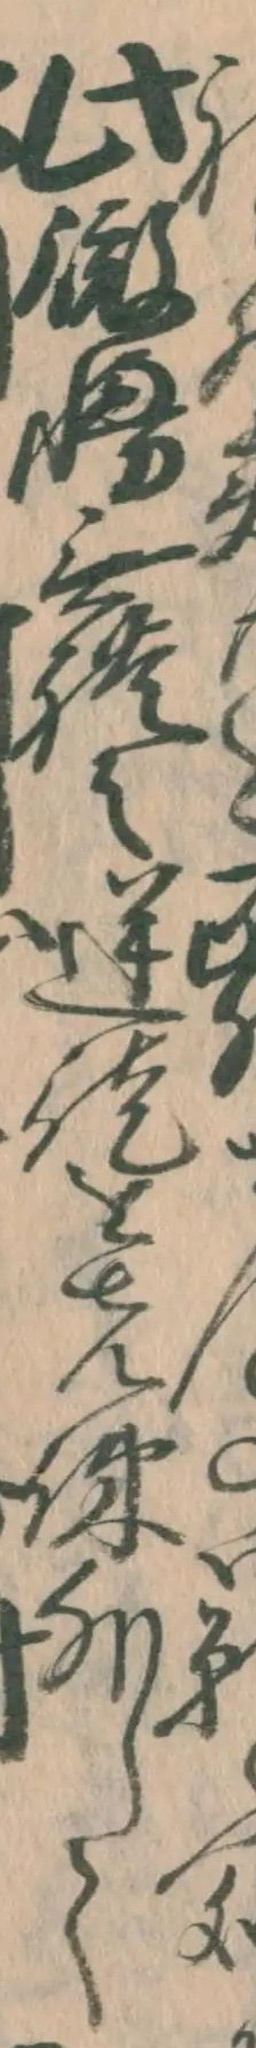此傲慢無禮之逆徒を先疎外して
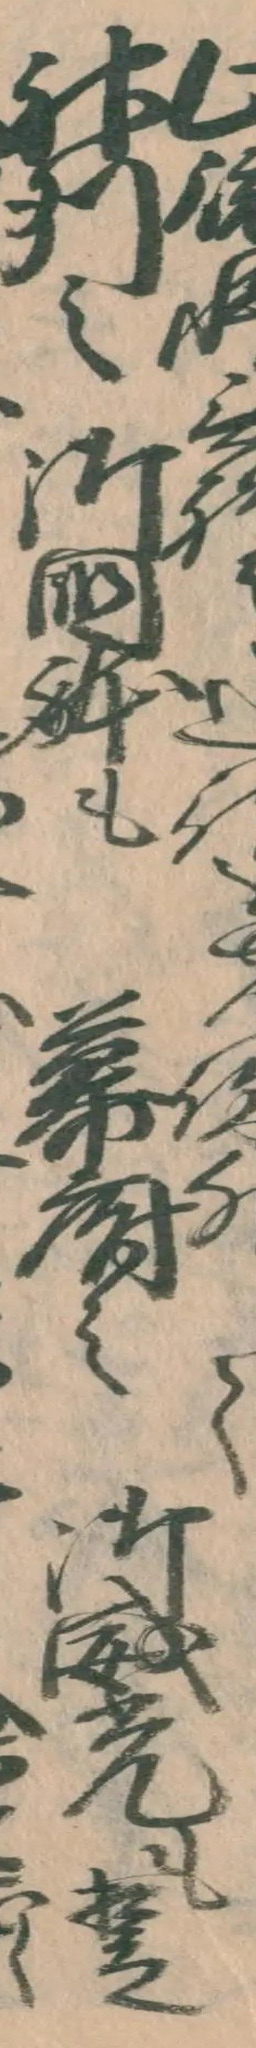神州之御国躰も幕府之御威光も相立
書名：麗斎叢書. 20
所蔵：国立国会図書館 National Diet Library, JAPAN
